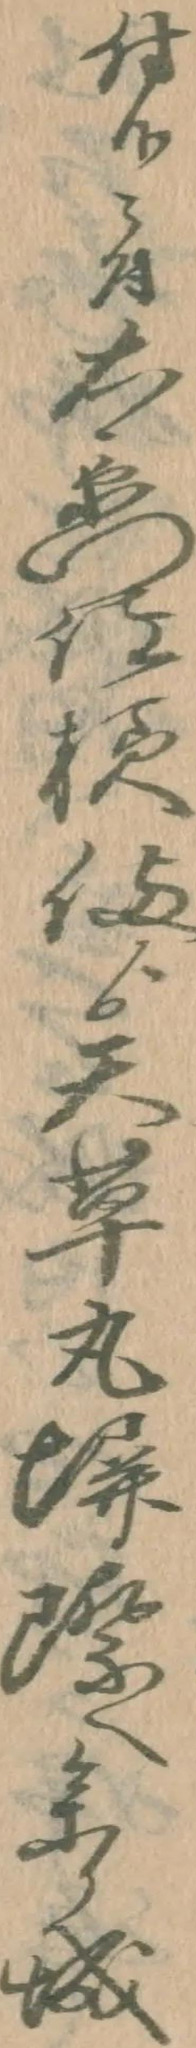付候に付右衛門佐様備ゟ天草丸塀際へ参り城
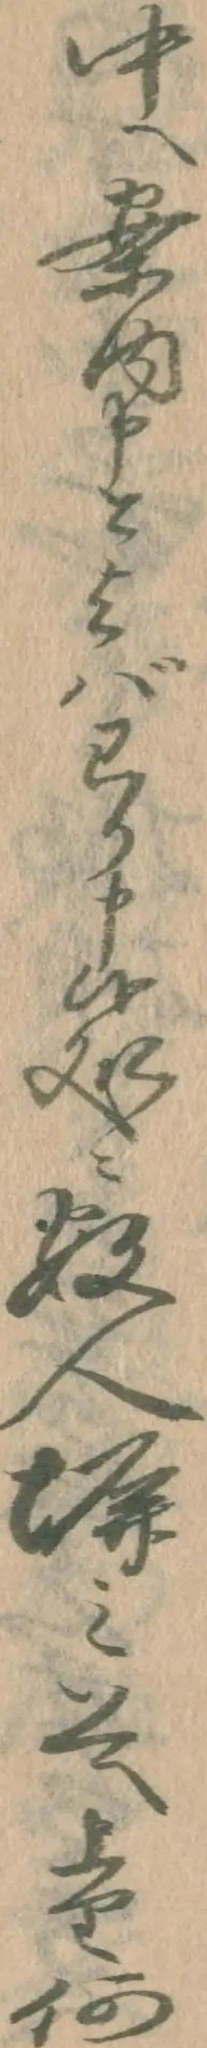中へ案内申と与ばわり申候処に数人塀之上へ上里何
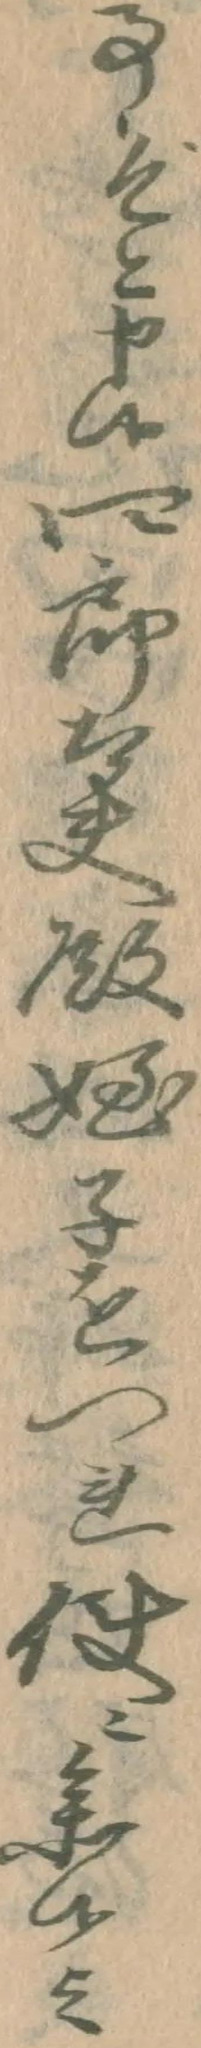事ぞと申候四郎太夫殿姪子をつ連使に参候与
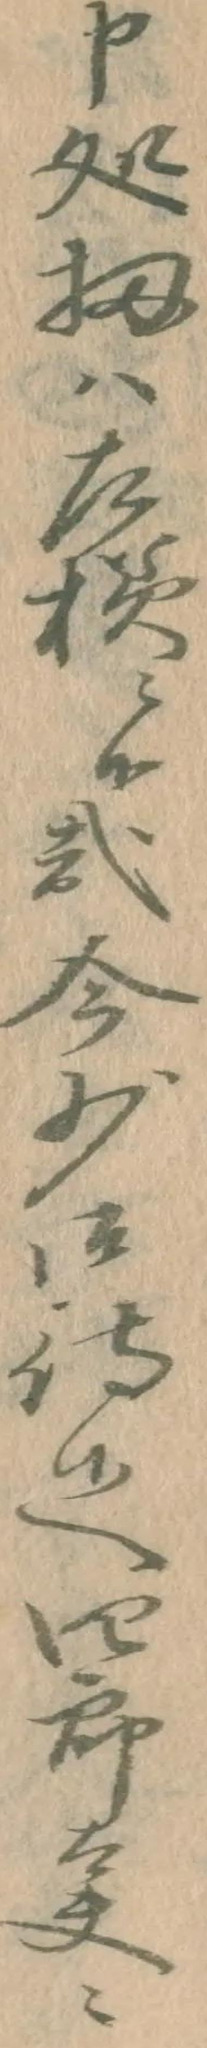申処扨は左様に候哉今少御待候へ四郎太夫に
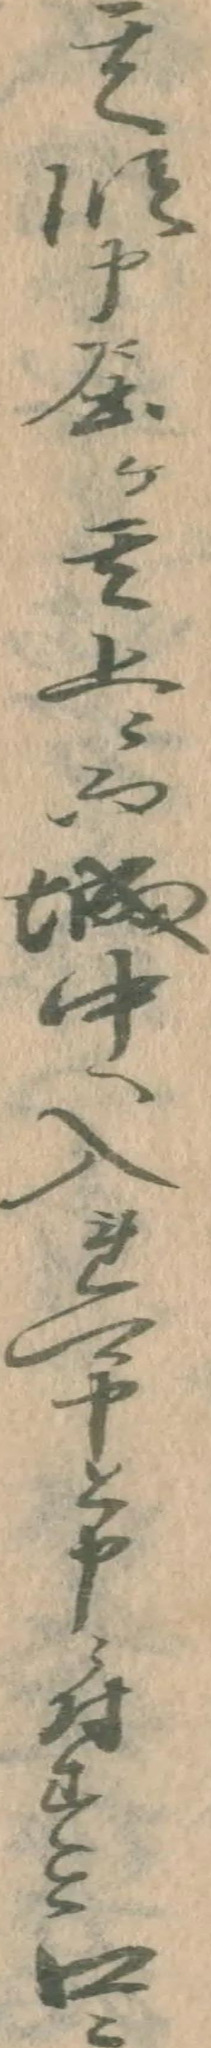其段申届け其上に而城中へ入連可申と申に付春と口に
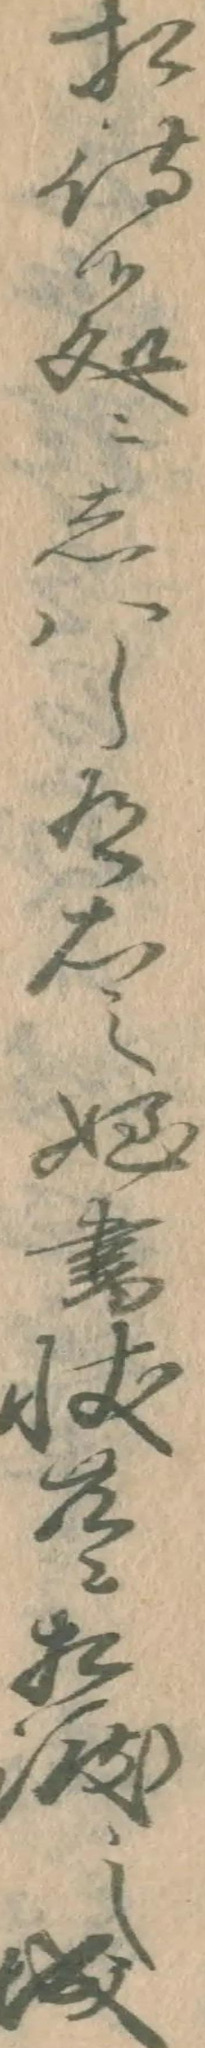相待候処に志はし有右之姪書状共に相渡し城
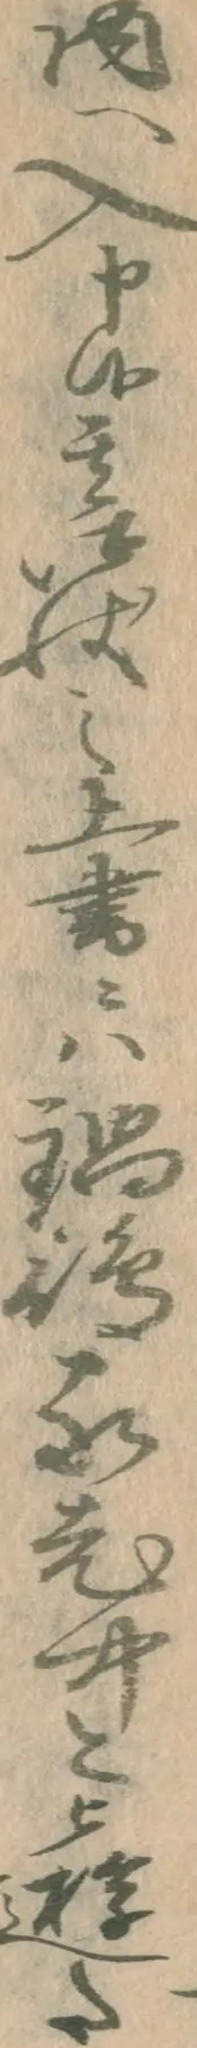内へ入申候其御状之上書には鍋島家老中と被遊た
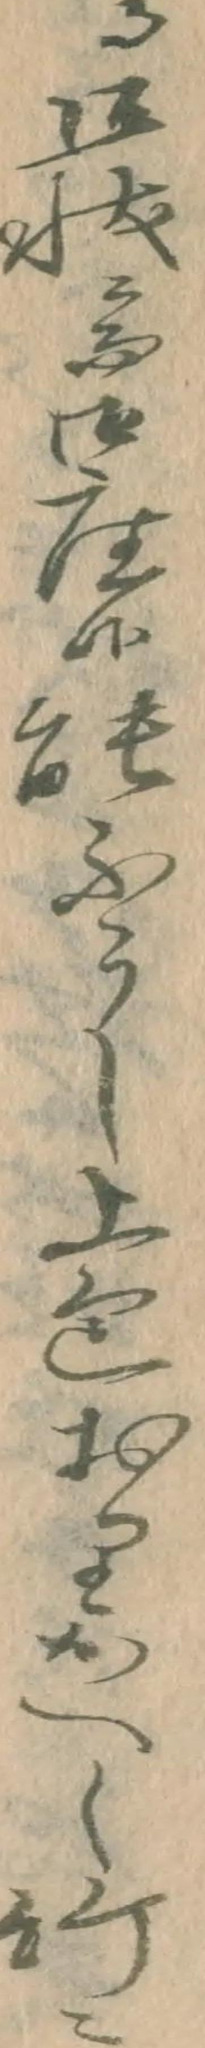る御状に而御座候能ふうし上包お里かへし竹に

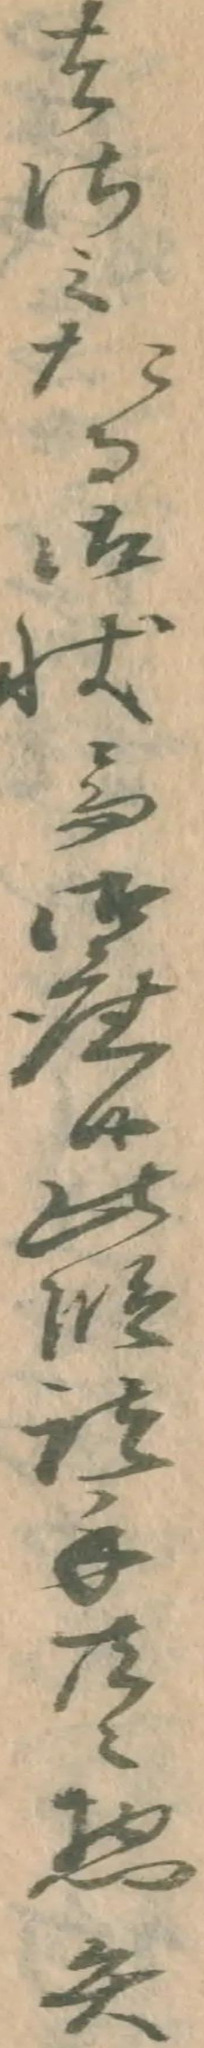者佐みたる御状に而御座候此段諸手共に惣矢
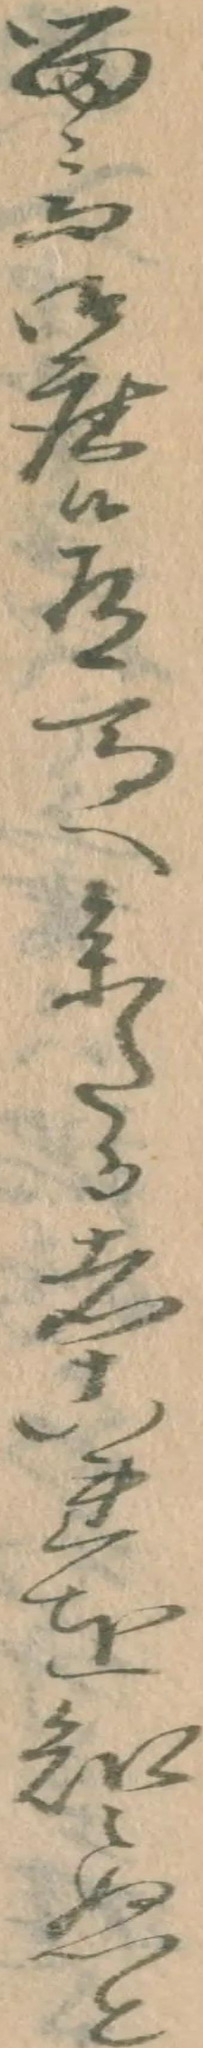留に而御座候有馬へ参たる者古連を知ら怒と
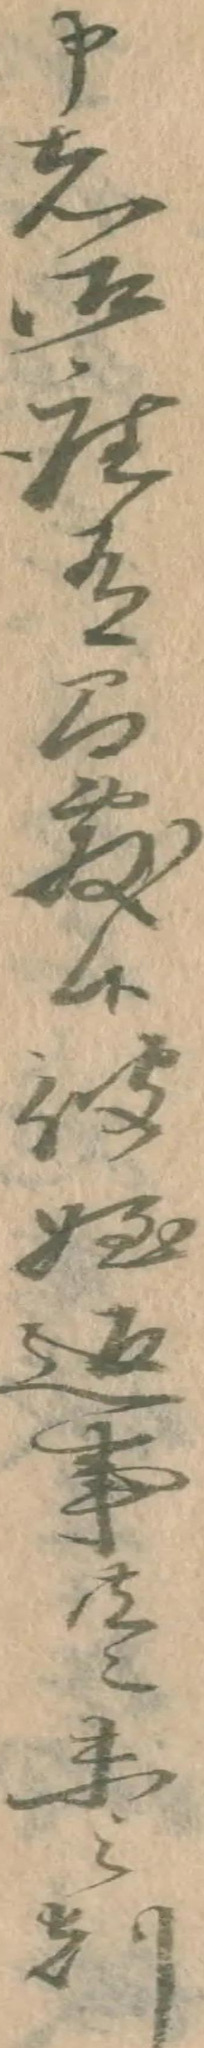申者御座有間敷候彼姪返事共に未之刻
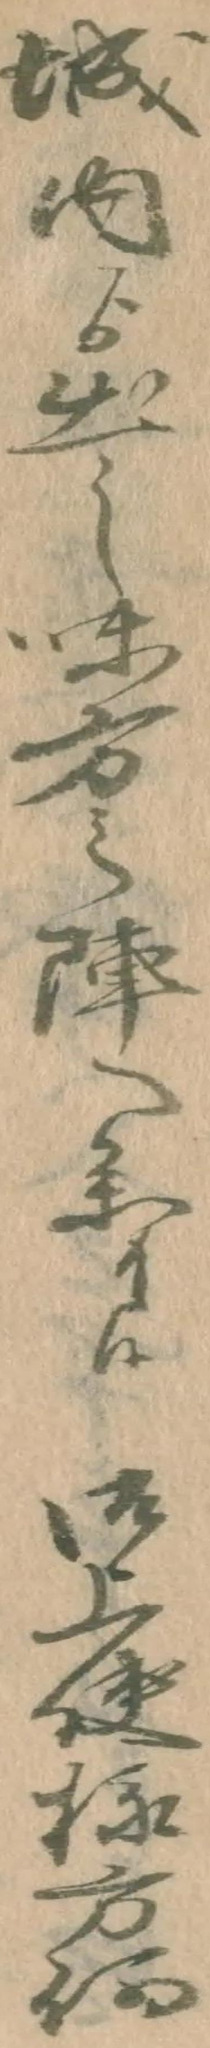城内ゟ出し味方之陣へ参り候御上使様方何
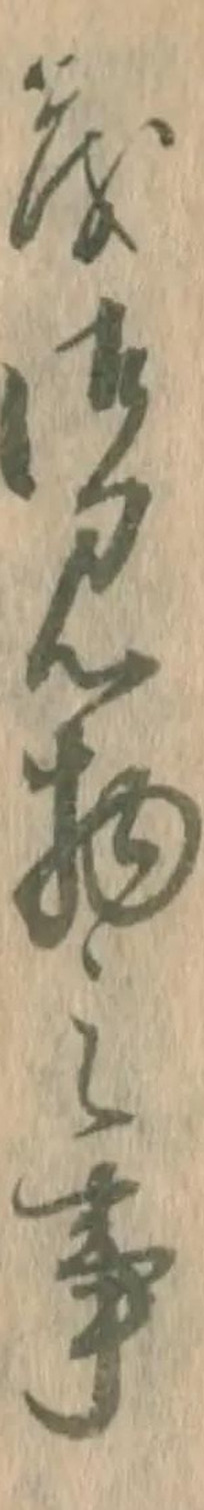茂御見物之事
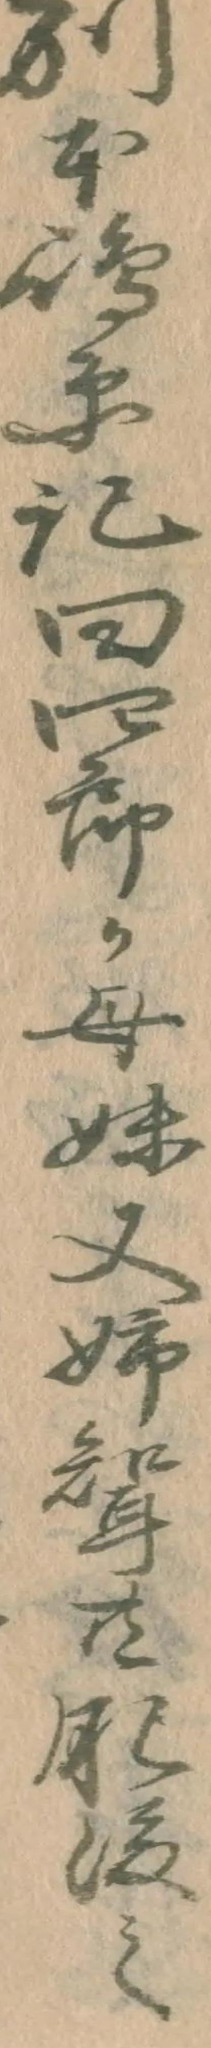別本島原記曰四郎か母妹又姉聟共肥後之
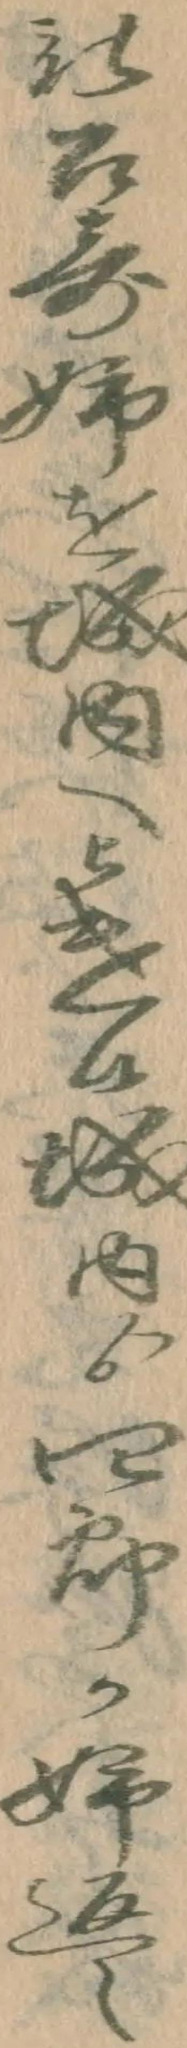被召寄姉を城内へ被遣候城内ゟ四郎か姉返し
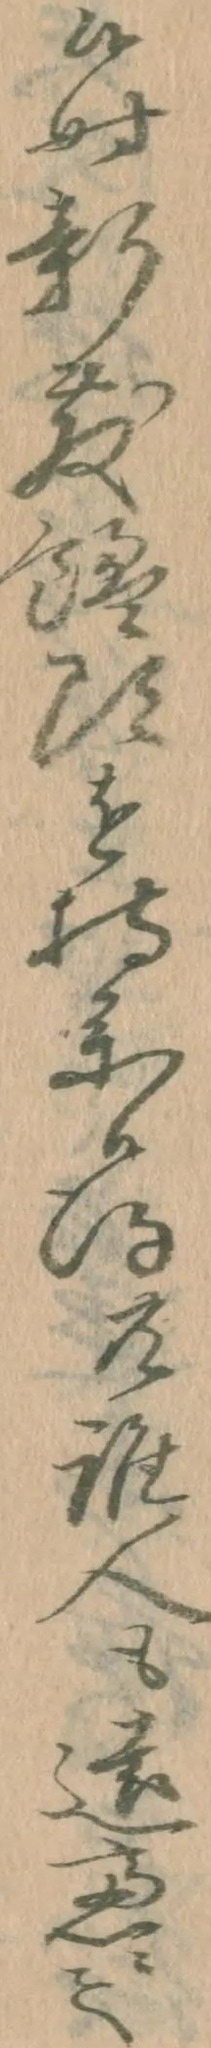候時新敷饅頭を持参候得共誰人も遠慮にて
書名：切支丹御退治記 49巻. [6]
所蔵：国立国会図書館 National Diet Library, JAPAN
